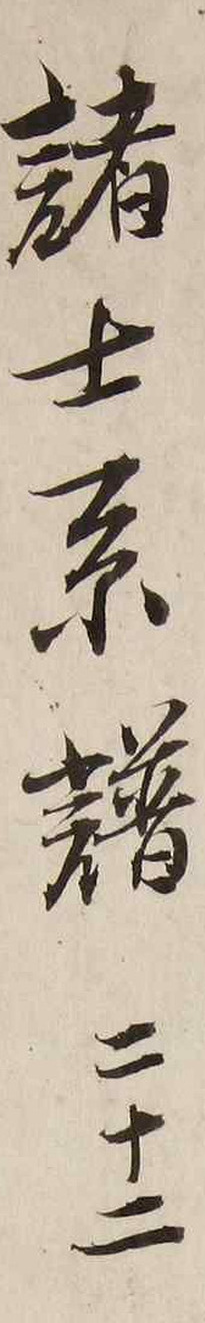諸士系譜二十二

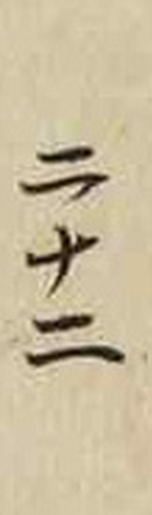二十二
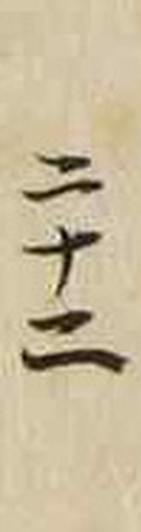二十二

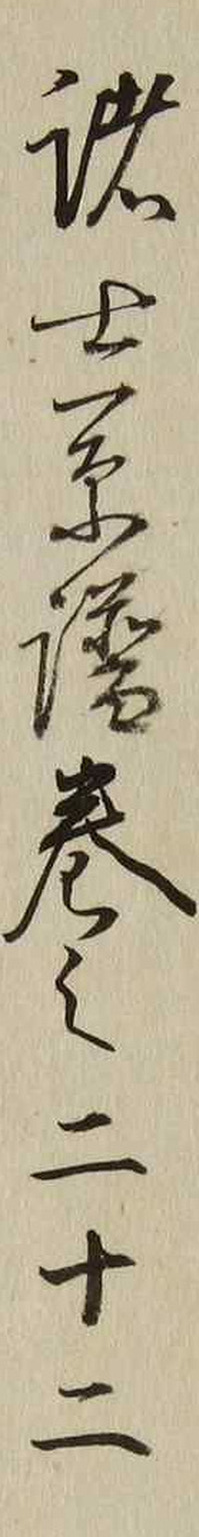諸士系譜巻之二十二
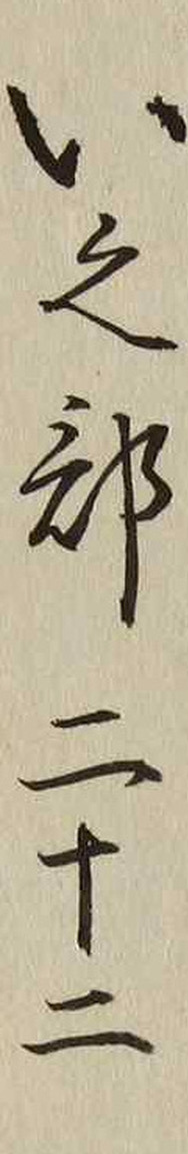い之部二十二
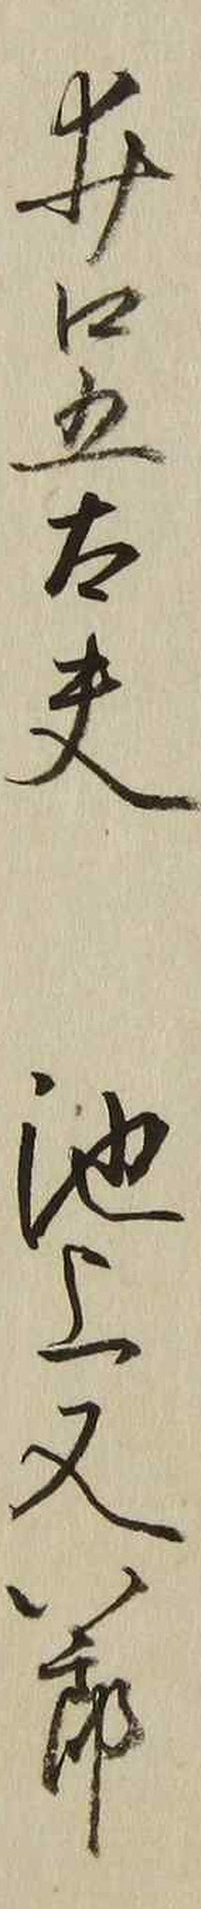井口五太夫池上又八郎

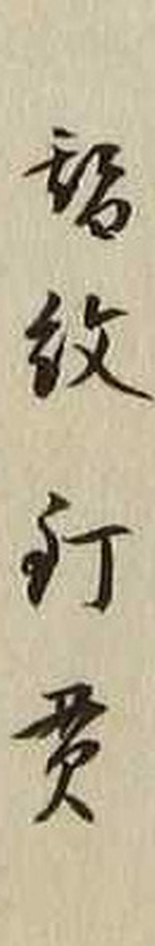替紋釘貫
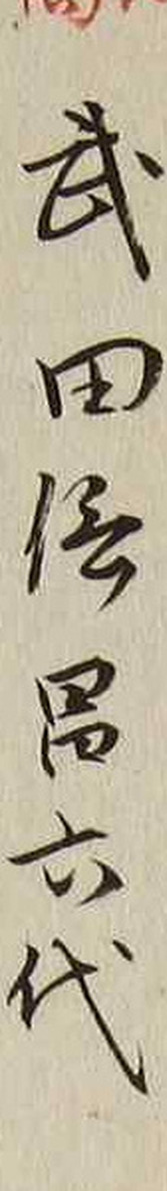武田信昌六代
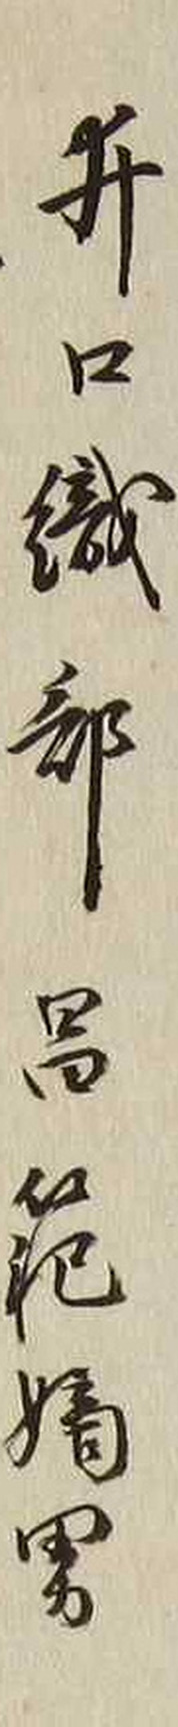井口織部昌範嫡男
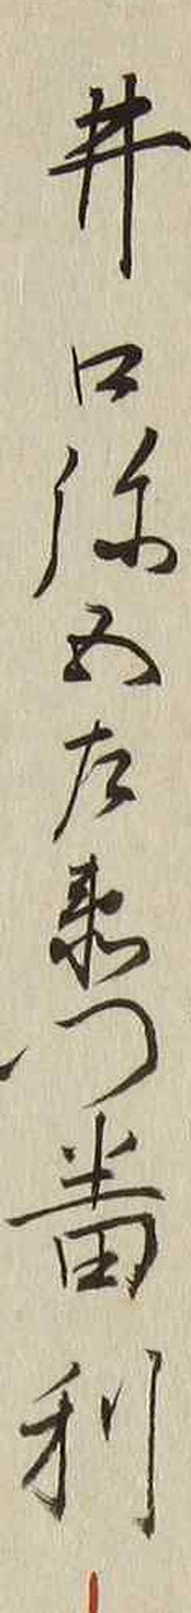井口弥五左衛門番利
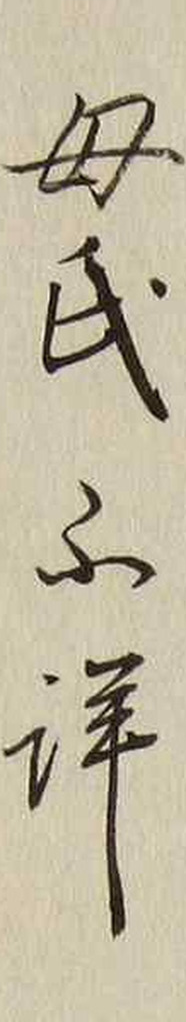母氏不詳
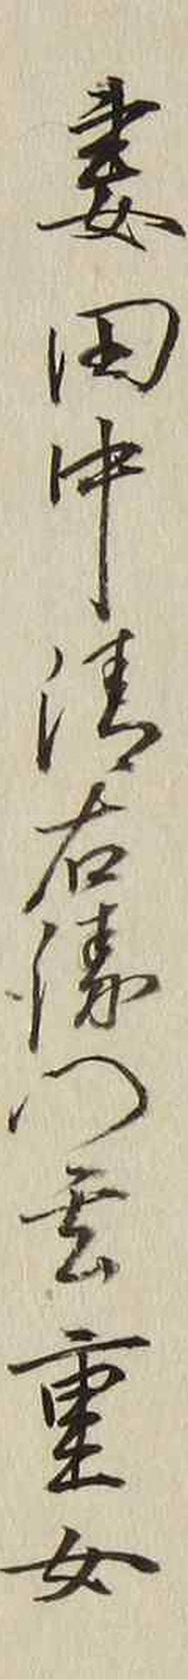妻田中清右衛門玄重女

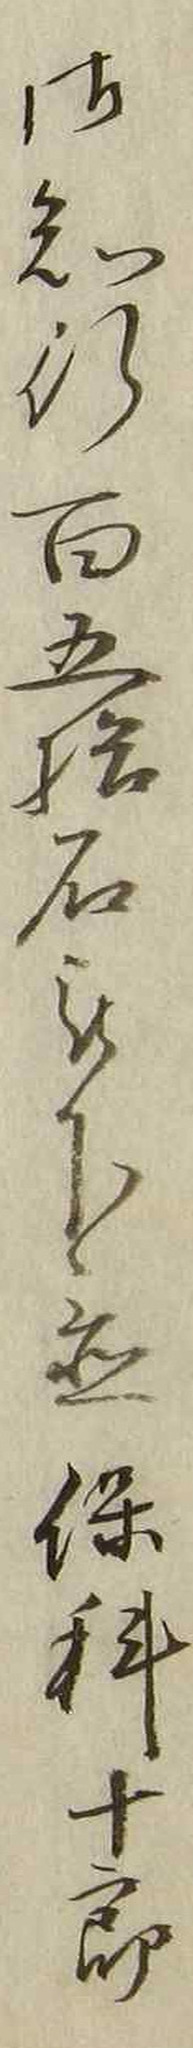御知行百五拾石被下置保科十郎
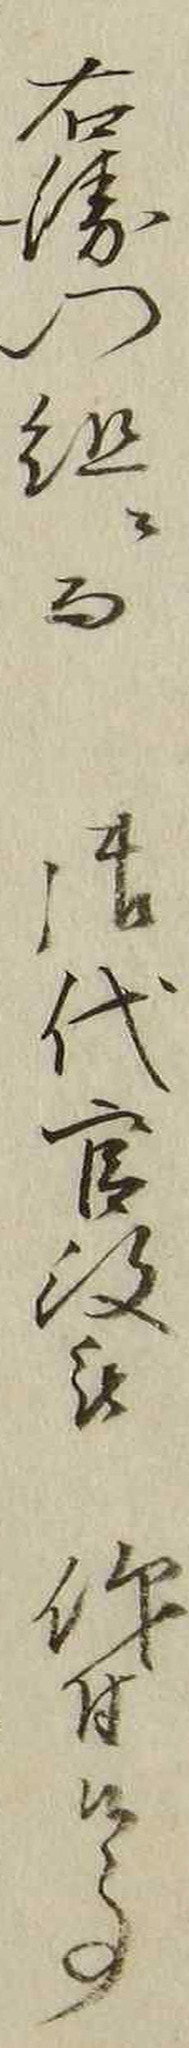右衛門組ニ而御代官役被仰付候事
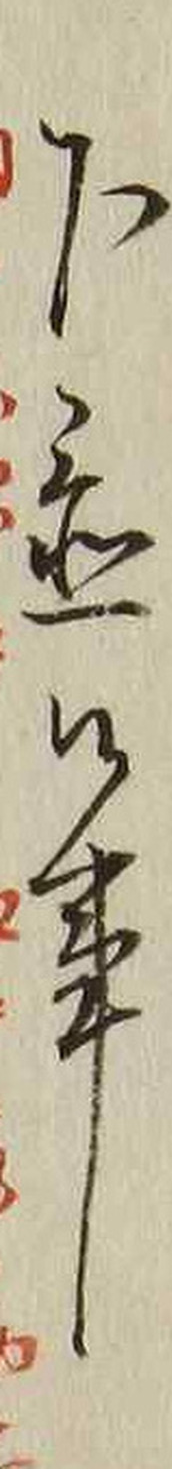下置候事
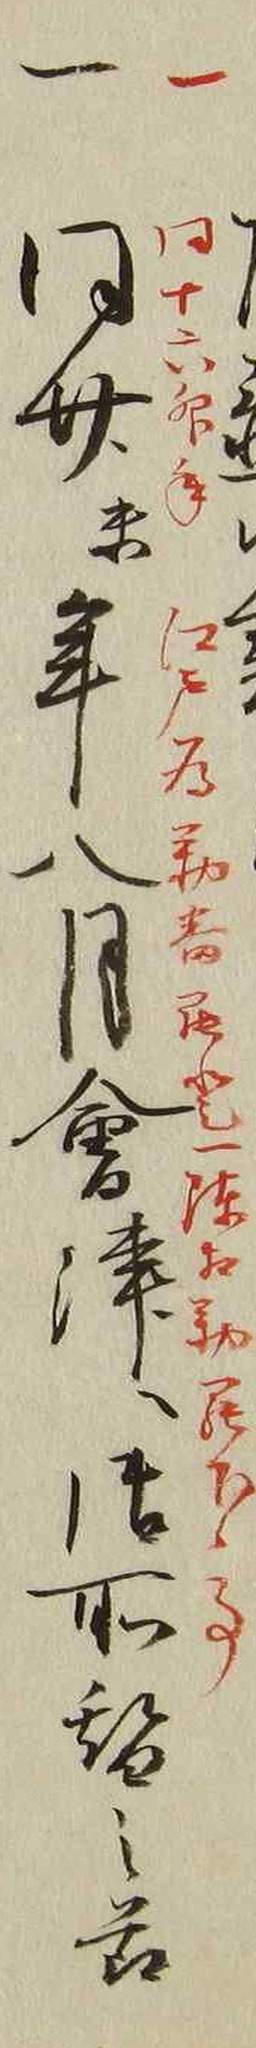一同廿未年八月会津へ御所替之節
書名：諸士系譜　巻之22　い之部22
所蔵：会津若松市立会津図書館
